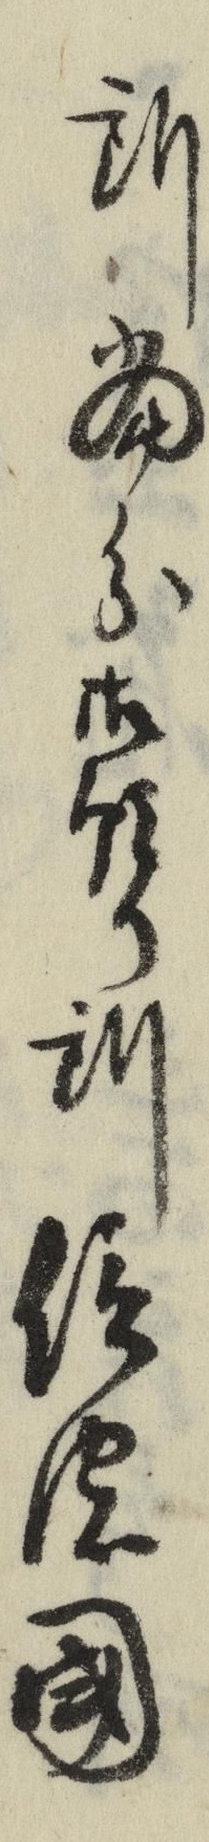所当分御預り所信濃国
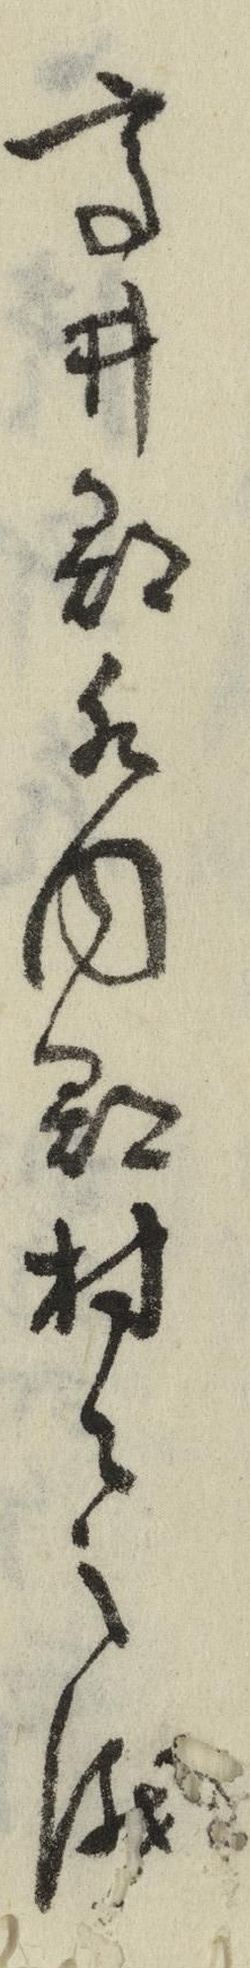高井郡水内郡村々之儀
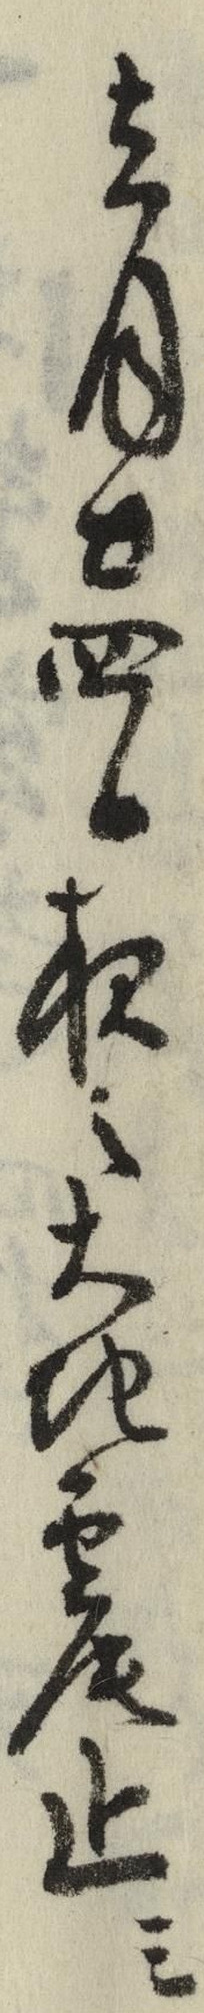去月廿四日夜之大地震止ミ
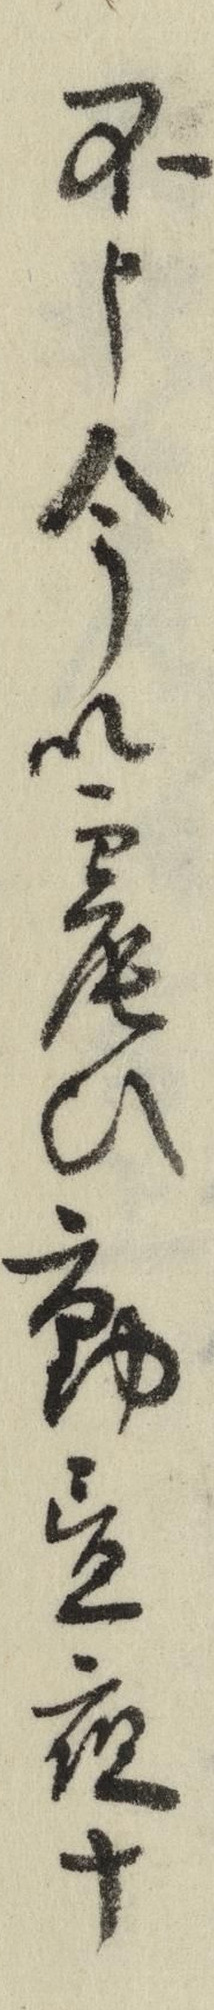不申今以震ひ動昼夜十
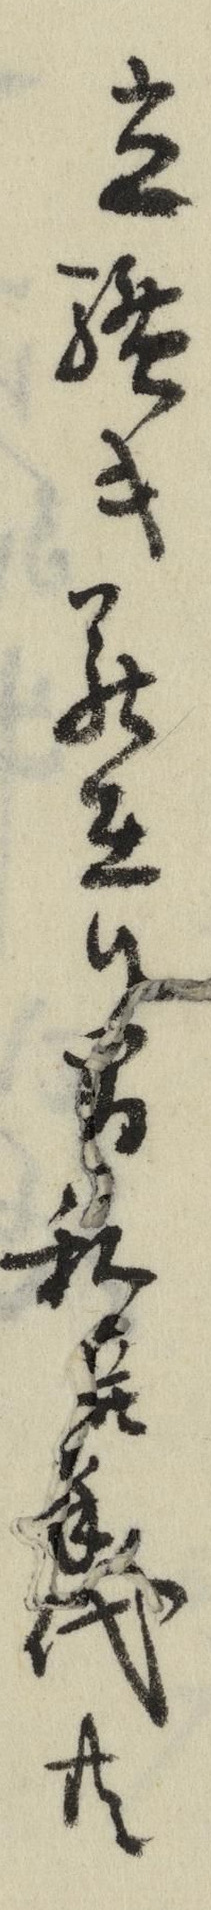立騒キ罷在候間私并手代共
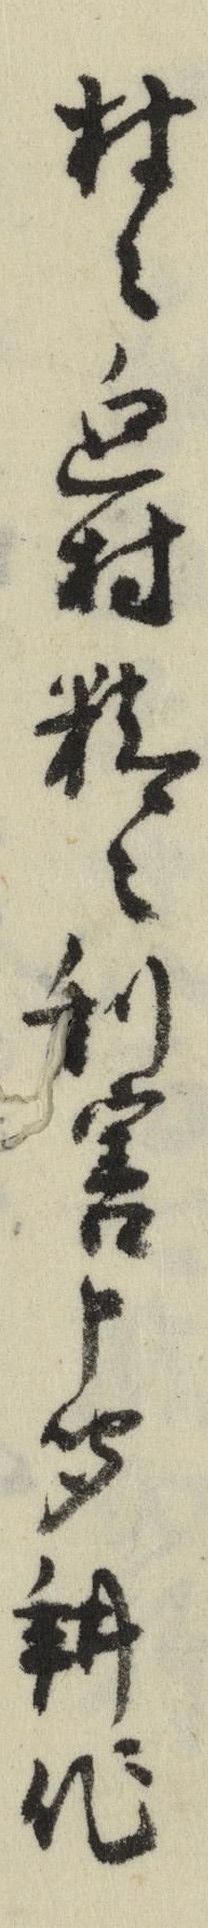廻村精々利害申聞耕作
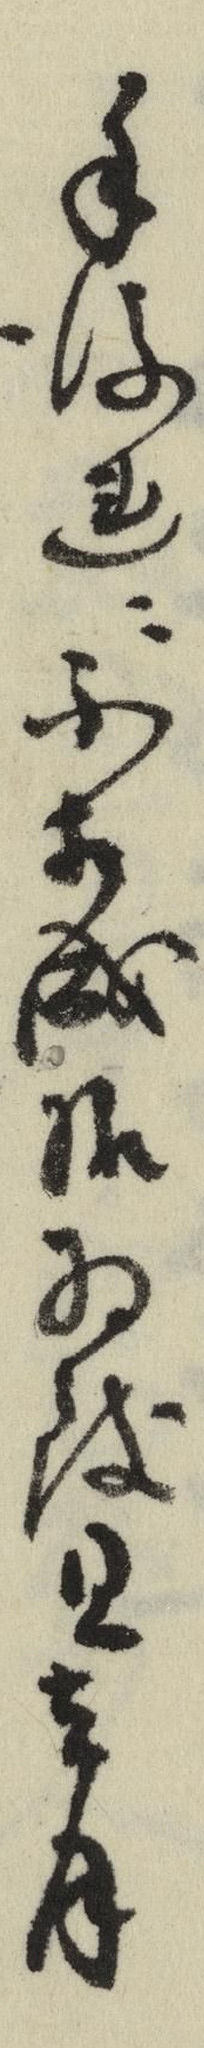手後れ二不相成様為致且
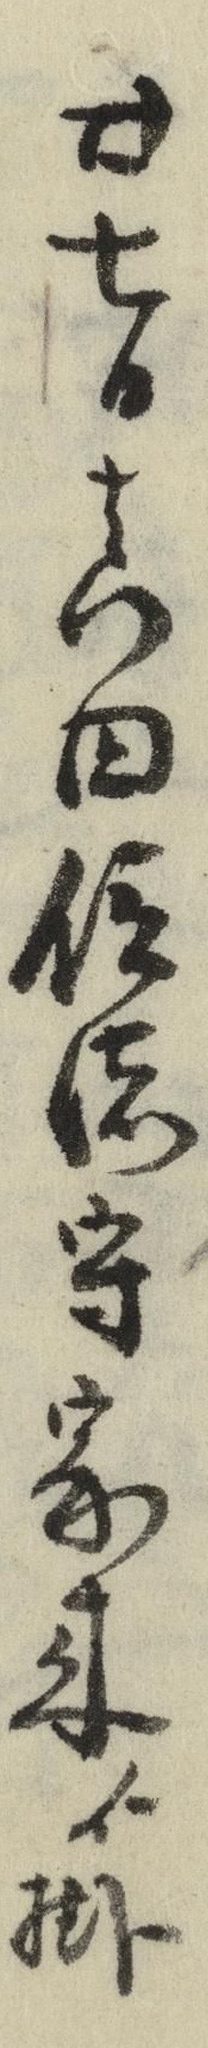廿七日真田信濃守家来ゟ掛
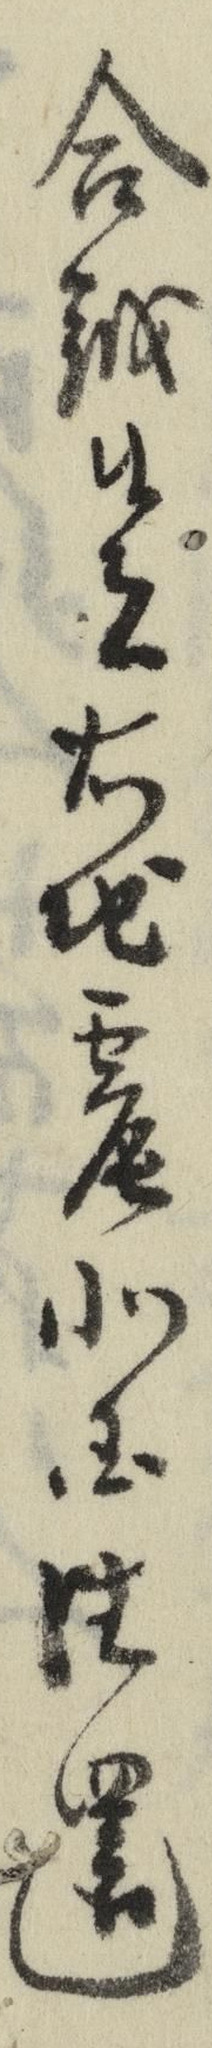合越候者右地震北国往還
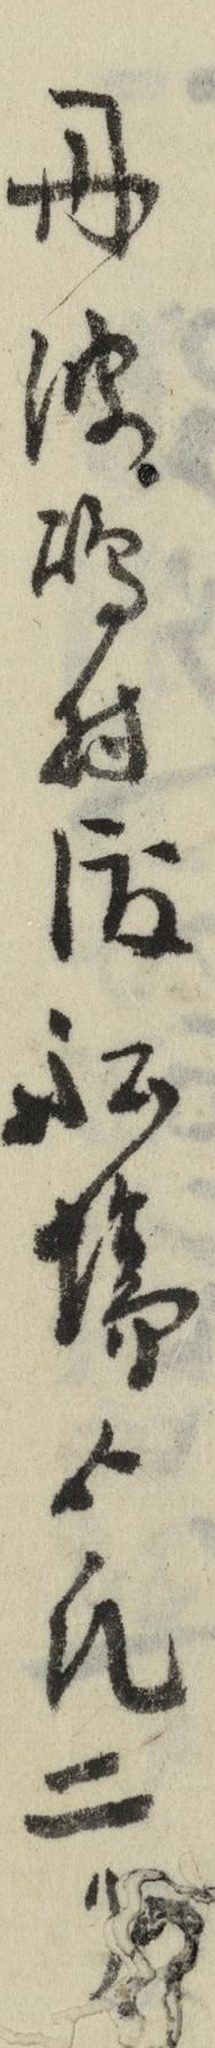丹波嶋村渡舟場ゟ凡二リ

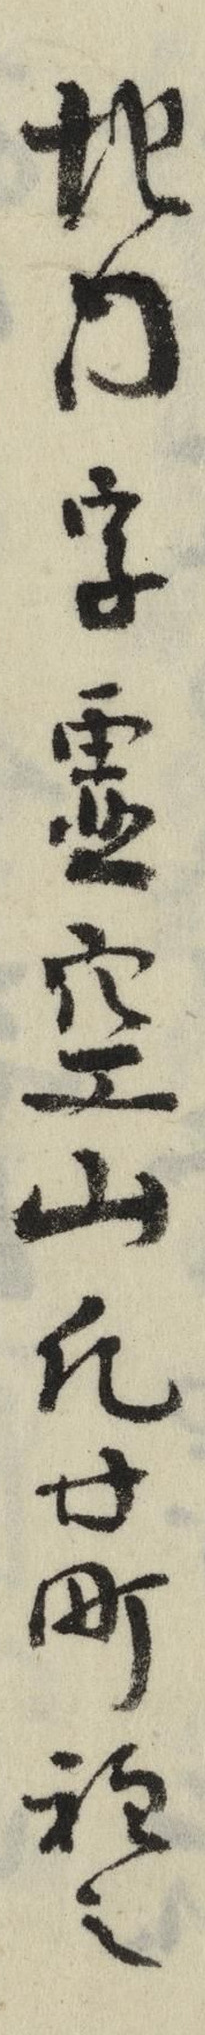地内字虚空蔵山凡廿町程之
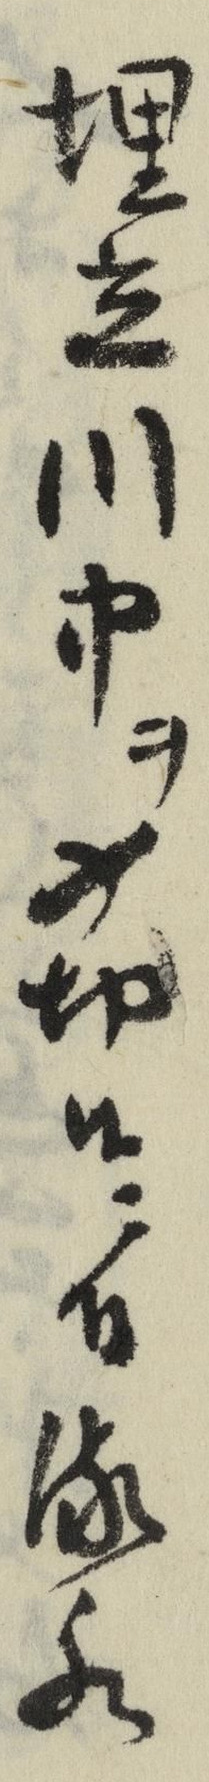埋立川幅を〆切候二付流水
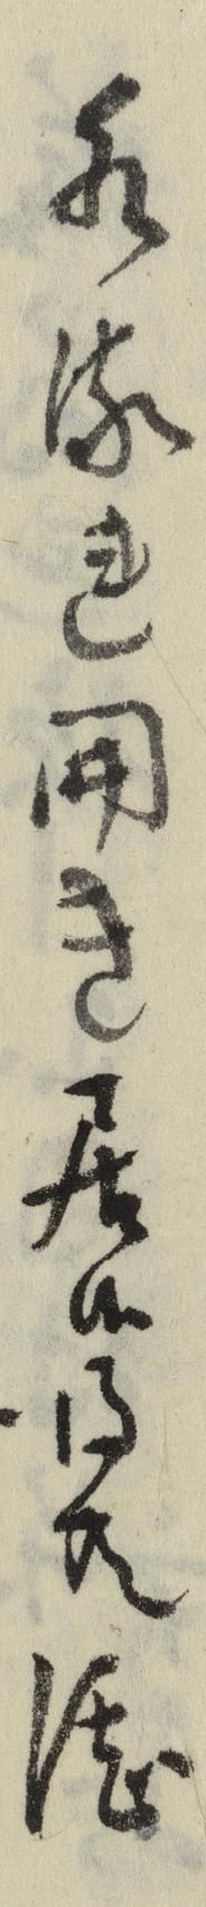水流れ開き居候得共湛
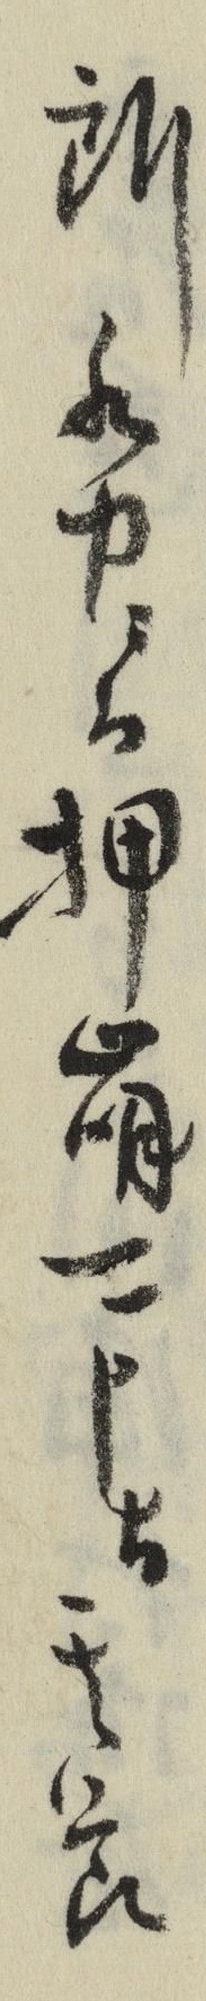所水力二而押崩可申と其節
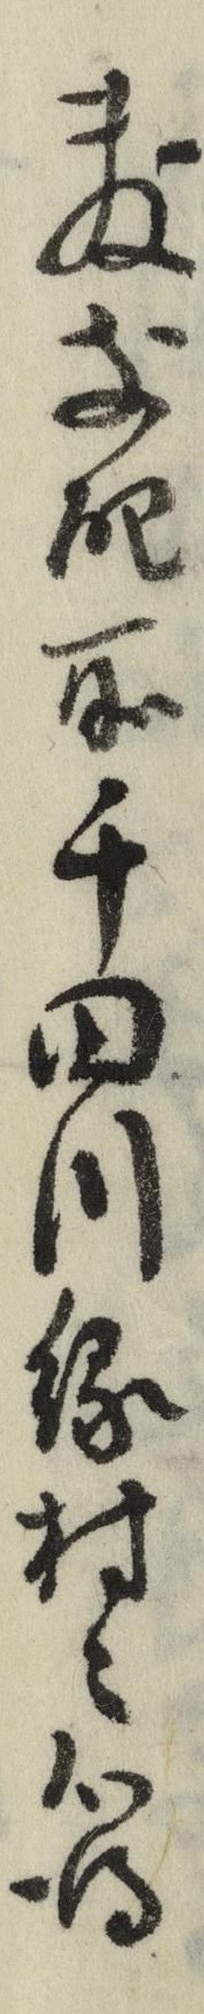敷支配所千曲川縁村々心得
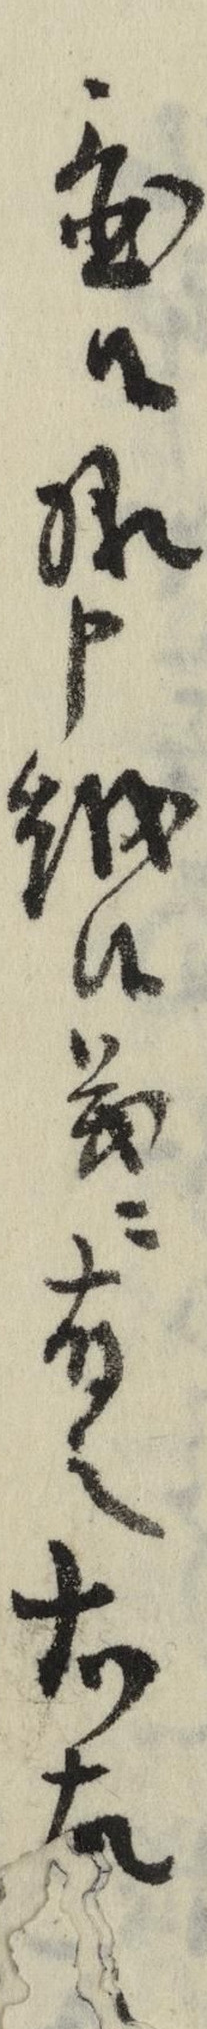置候様申越候義二有之右故当時
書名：信州大地震一件之冩　丁未弘化四年三月吉日
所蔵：東京大学地震研究所図書室 Earthquake Research Institute Library, The University of Tokyo, JAPAN
